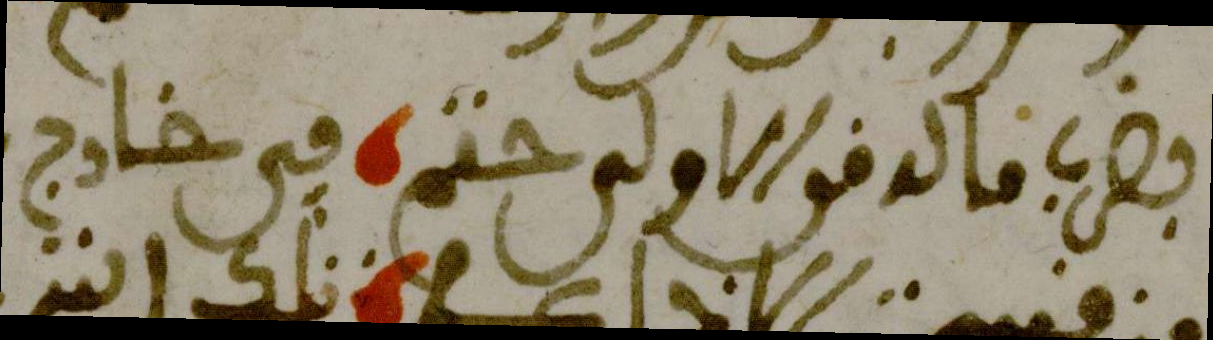بضرب ماله من الاولى حتم في خارج
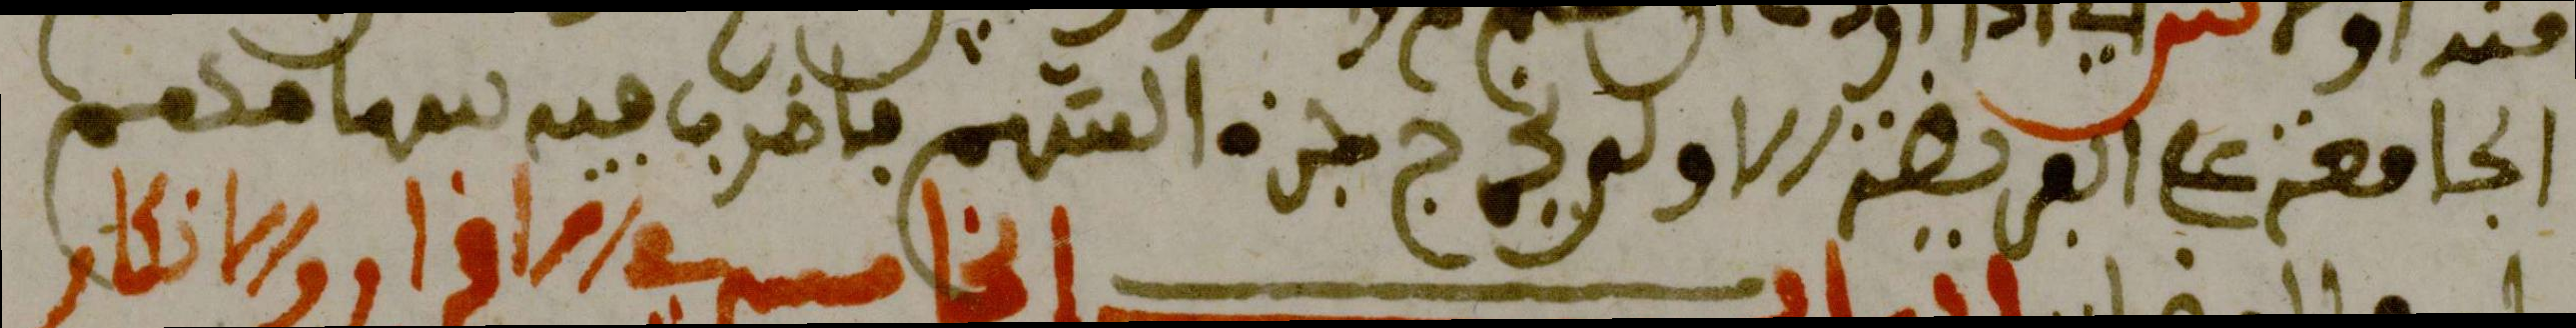الجامعة على الفريضة الاولى يخرج جزء السَّهم فاضرب فيه سهامهم
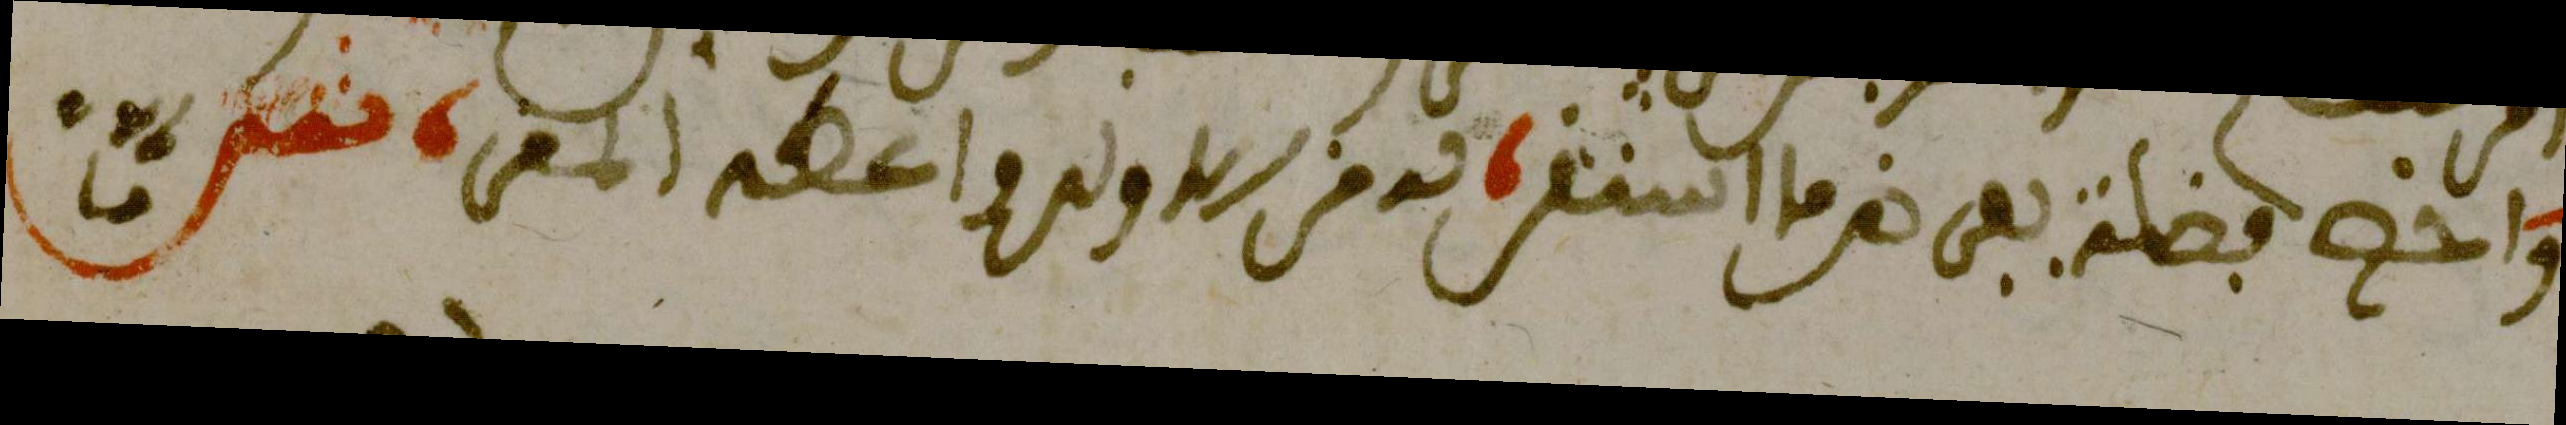وَاحص فضلة يضرب ما استقر له من الاولى واعطه المقرر ش
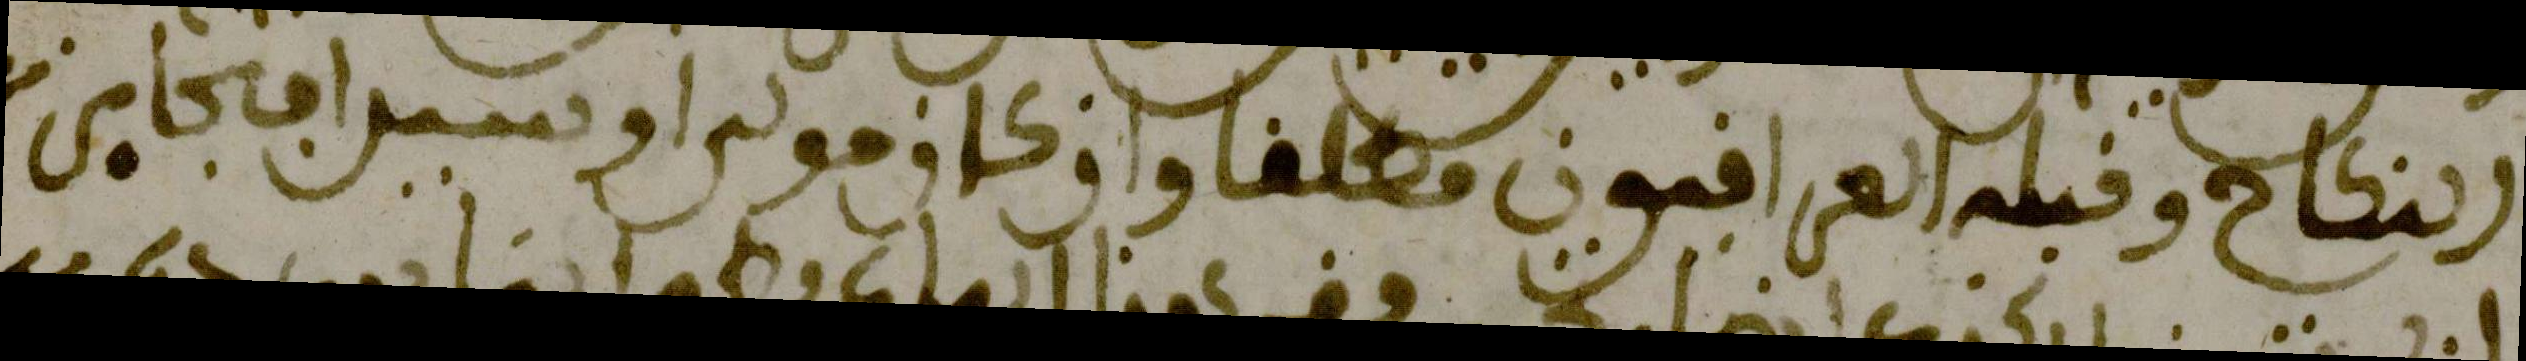النكاح وقبله العراقيون مطلقا وان كان مولى او سيده فجائز
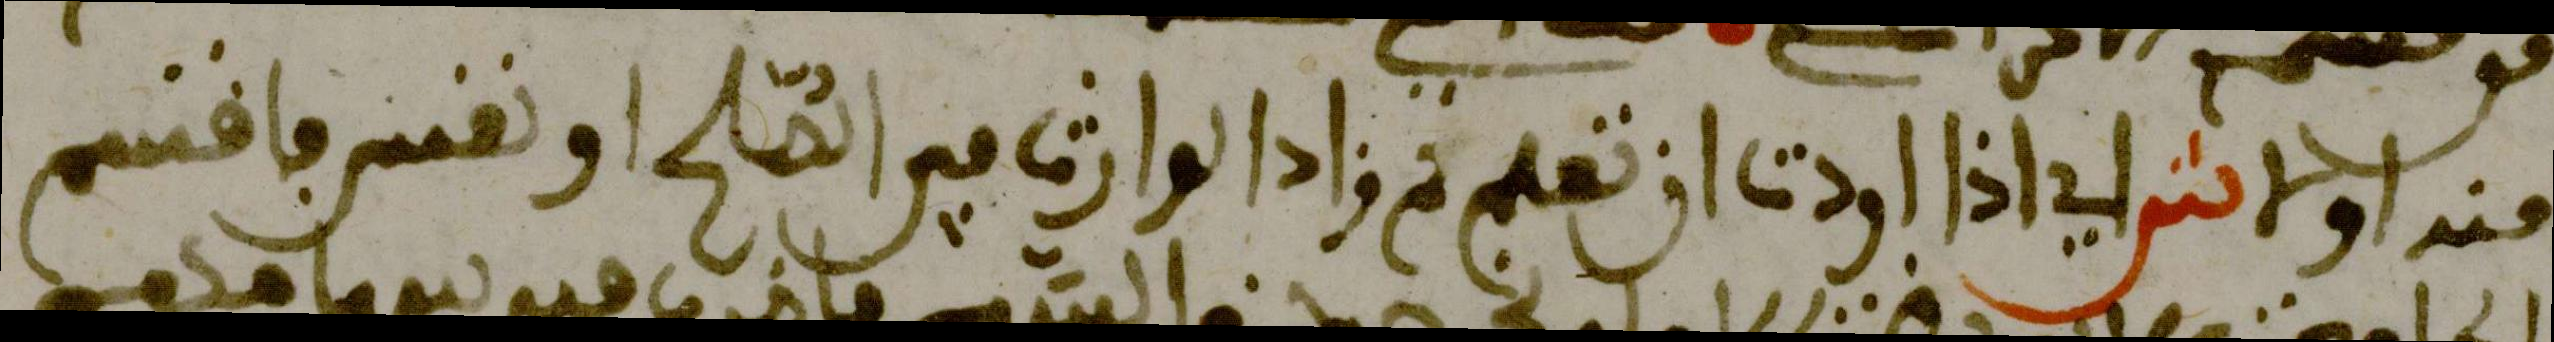منه اولا ش اي اذا اردت ان تعلم كم زاد الوارث في الصُلح او تقس فاقسم
